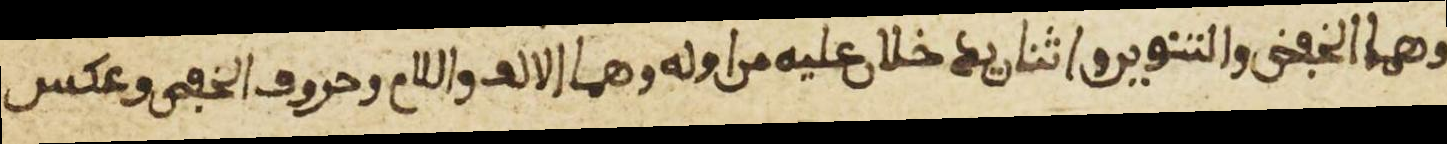و هما الخفض و التنوين و اثنان يدخلان عليه من اوله و هما الالف و اللام و حروف الخفض و عكس
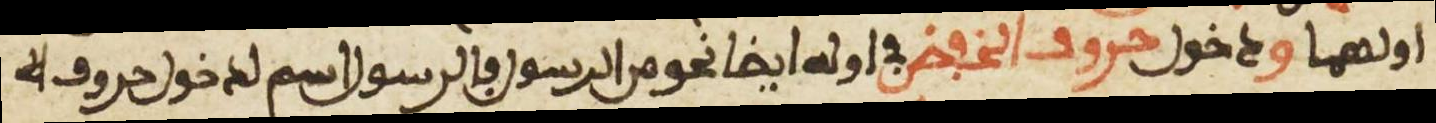اولهما و دخول حروف الخفض في اوله ايضا نحو من الرسول فالرسول اسم لدخول حروف
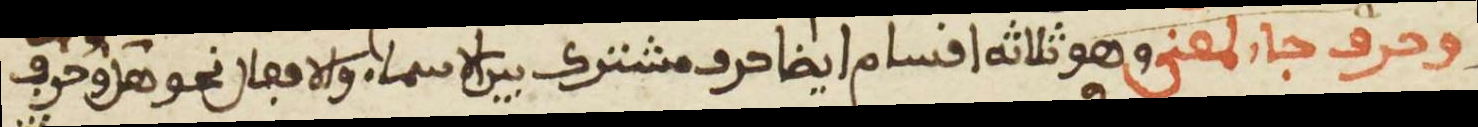و حرف جاء المعنى و هو ثلاثة اقسام ايضا حرف مشترك بين الاسماء و الافعال نحو هل و حرف
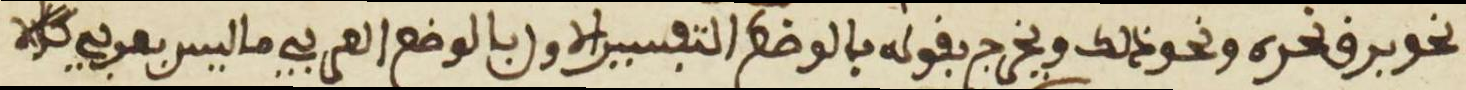نحو برق نحره و نحو ذلك و يخرج بقوله بالوضع التفسير الاول بالوضع العربي ما ليس بعربي
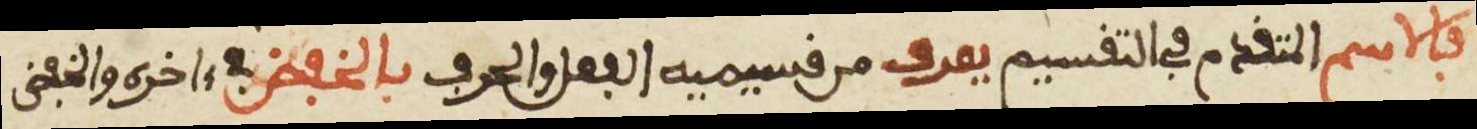فالاسم المتقدم في التقسيم يعرف من قسميه الفعل و الحرف بالخفض في آخره و الخفض
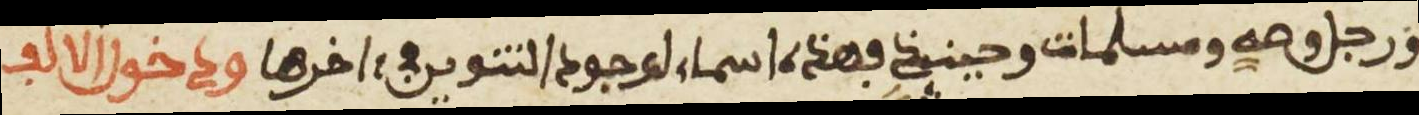و رجل و صه و مسلمات و حينيذفهذه اسماء لوجود التنوين في آخرها و دخول الالف
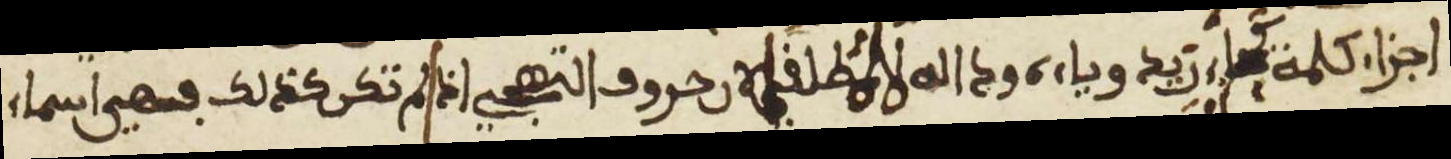اجزاء كلمة كزاء زيد و ياءه و داله حروف التهجي اذ لم تكن كذلك فهي اسماء
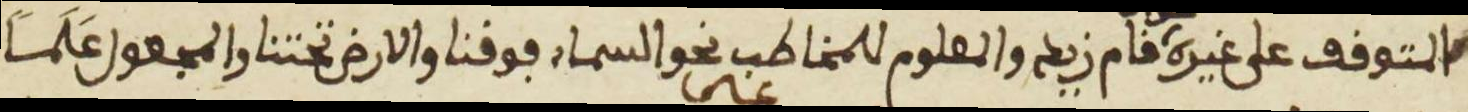المتوقف على غيره قام زيد و المعلوم للمخاطب نحو السماء فوقنا و الارض تحتنا و المجعول علما
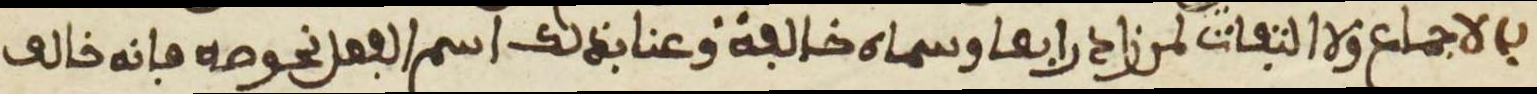بالاجماع و لا التفات لمن زاد رابعا و سماه خالقه و عنا بذلك اسم الفعل نحو صه فانه خالف
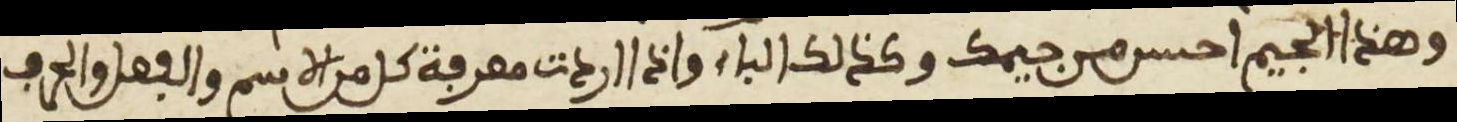و هذا الجيم احسن من جيمك و كذلك الباء و اذا اردت معرفة كل من الاسم و الفعل و الحرف
